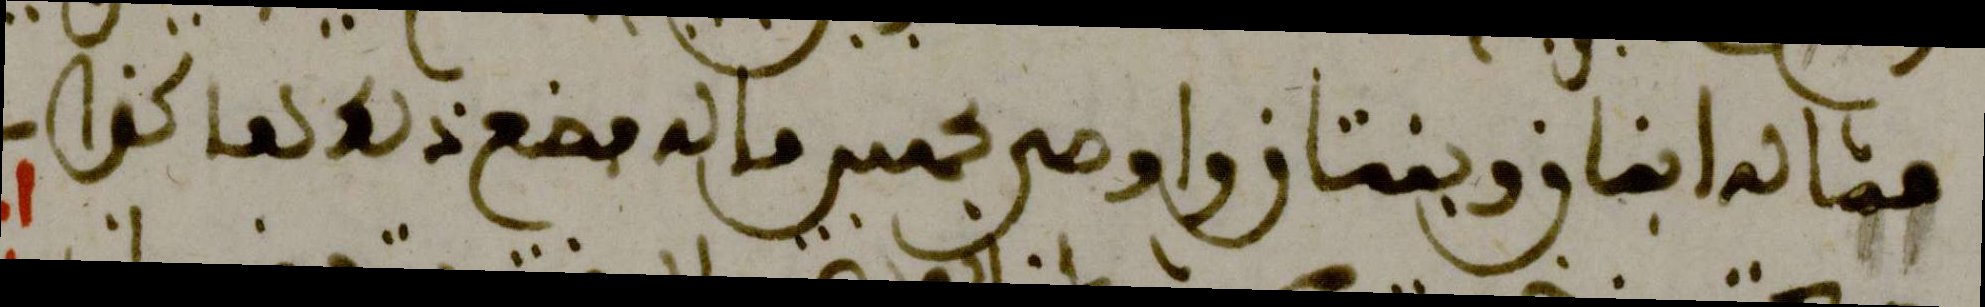مثاله انبان وبنتان واوصى بخمس ماله فضع ذلك هاكذا
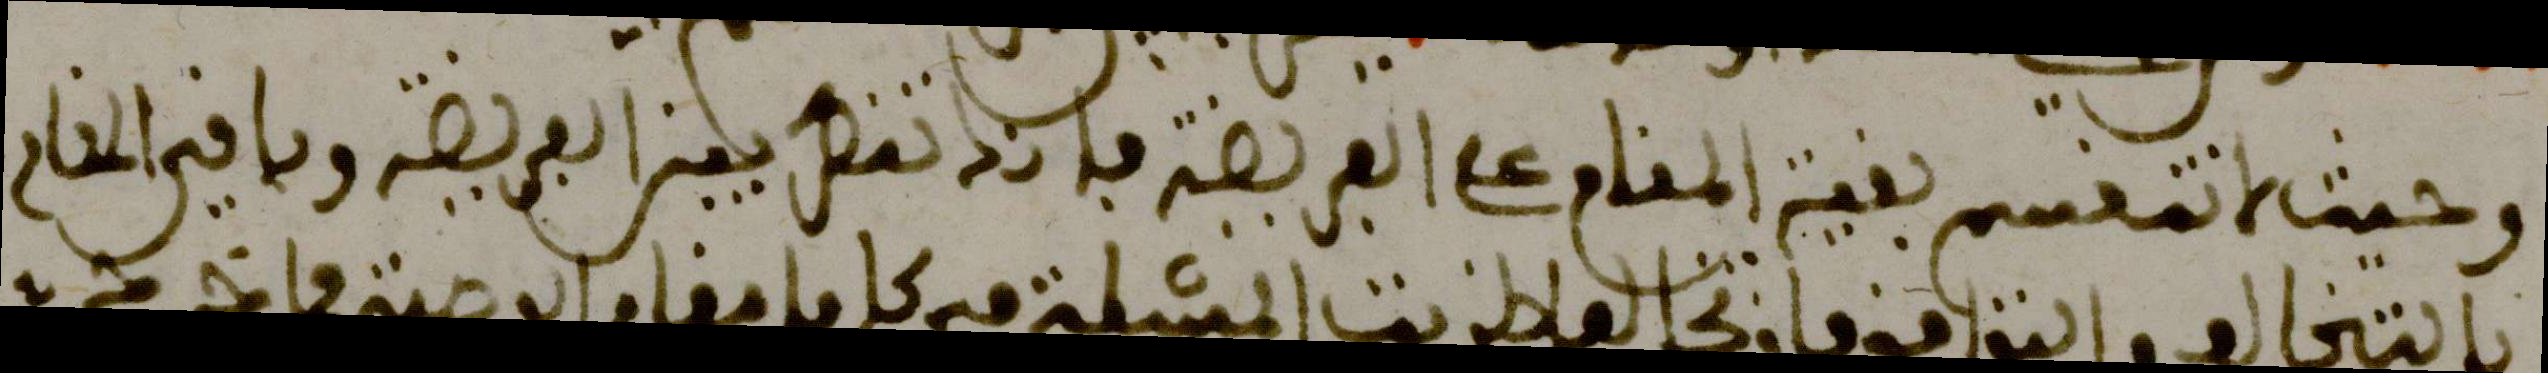وحيث لا تنقسم بقية المقام على الفريضة فانك تنطر بين الفريضة وباقي المقام
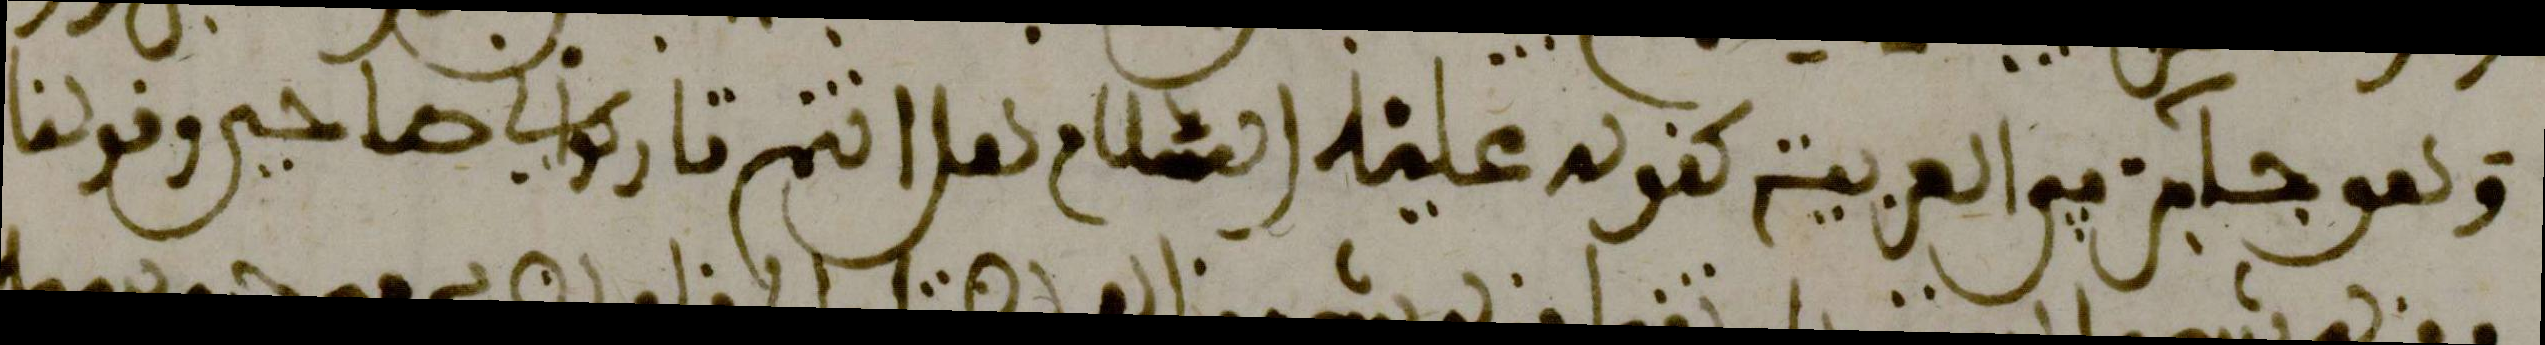وهو جائز في العربية كقوله عليه السلام هل انتم تاركوا لي صاحي وقولنا
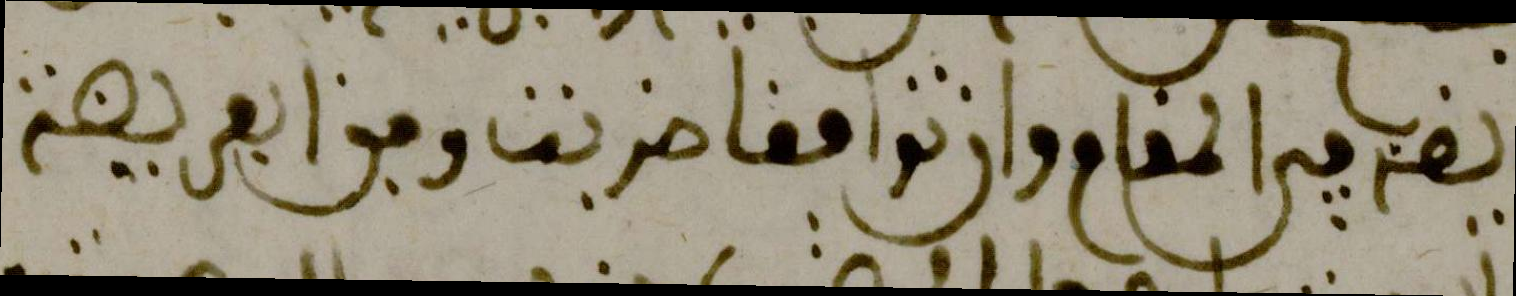يضة في المقام وان توافقا ضربت ومن الفريضة
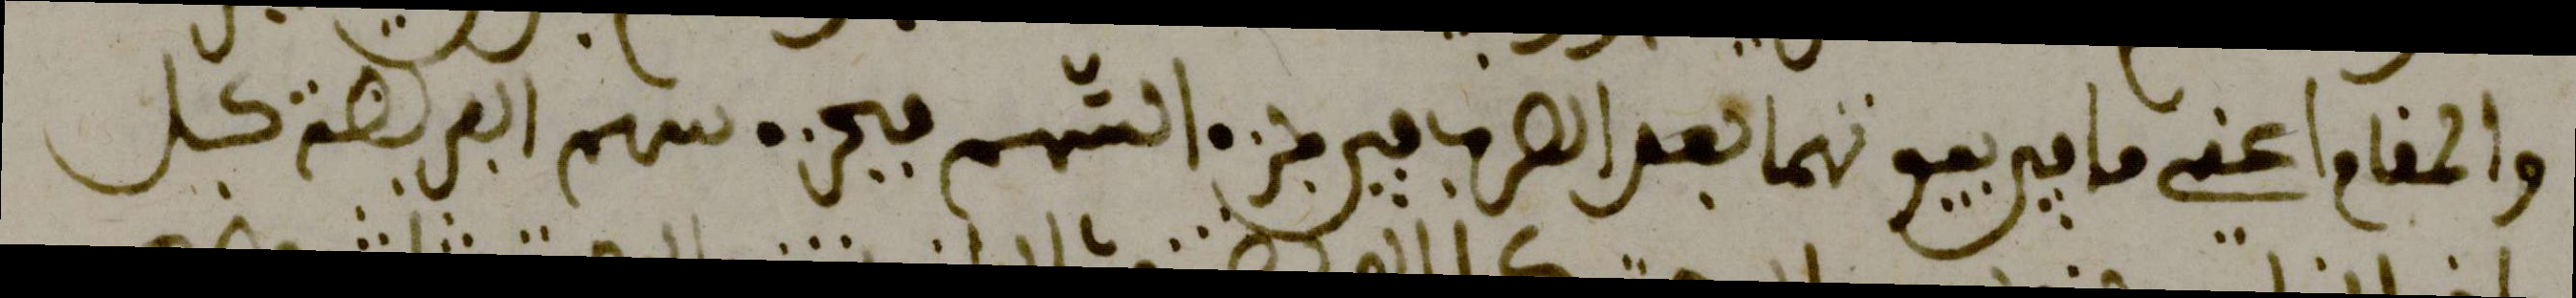والمقام اعني ما في بيوتهما بعد الضرب في جزء السّهم فجزء سهم الفريضة كل
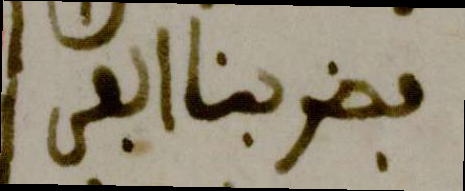فضربنا الفر
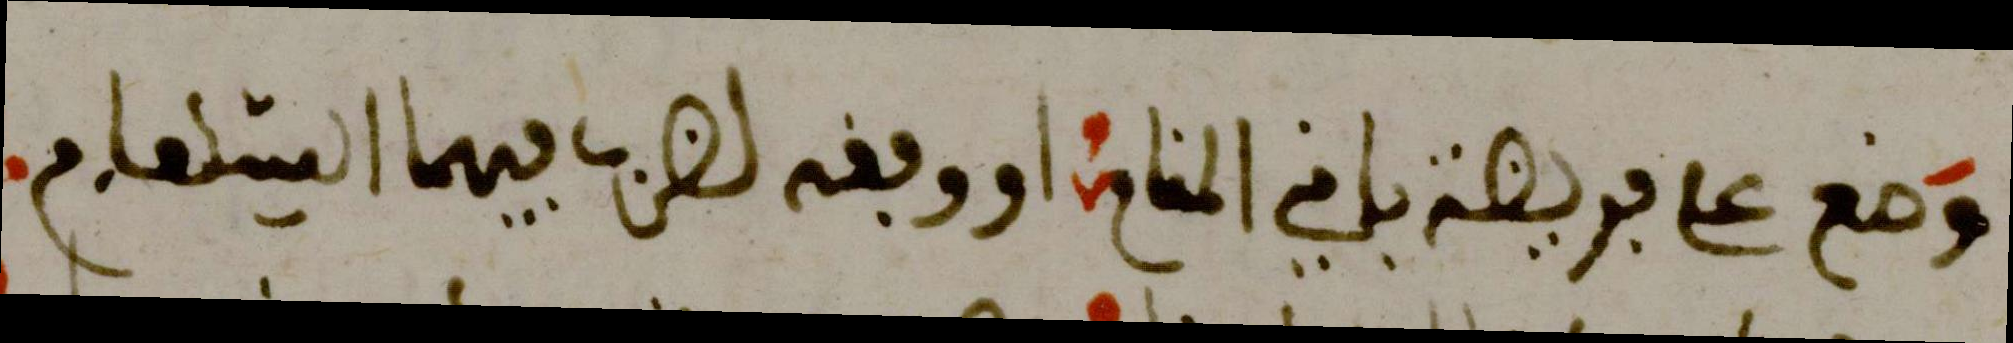وضع على فريضة باقي المقام او وفقه لضرب فيهما السهام
